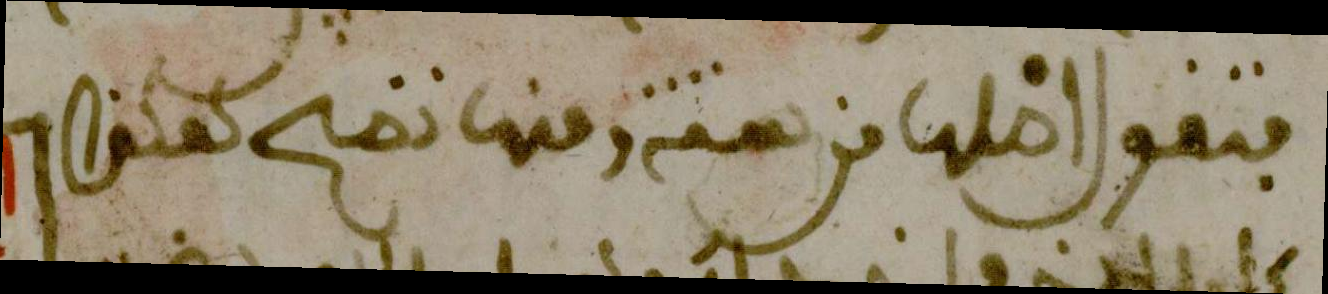فتقول اصلها من ستة ومنها تصح هكذا
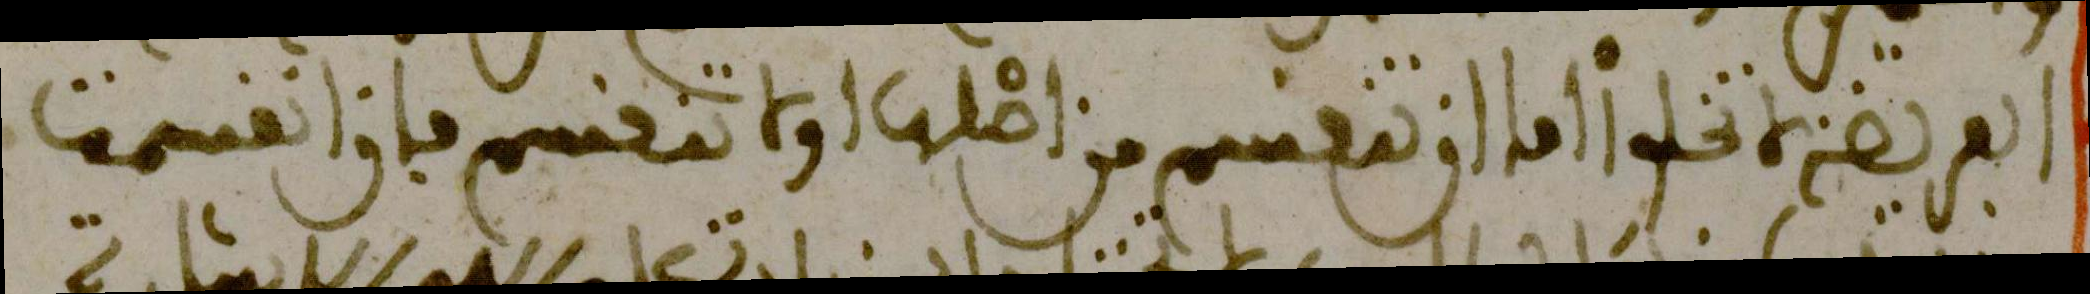الفريضة لا تخلوا اما ان تنقسم من اصلها اولا تنقسم فان انقسمت
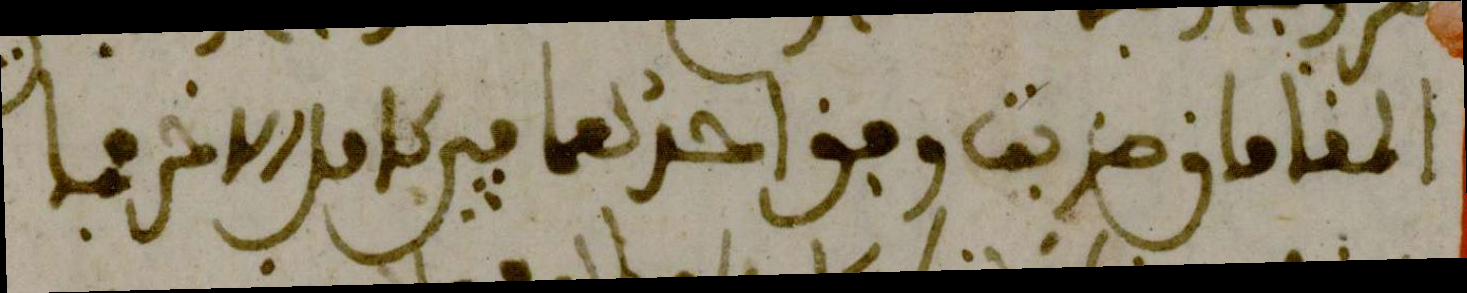المقامان ضربت وفق احدهما في كامل الاخر مما
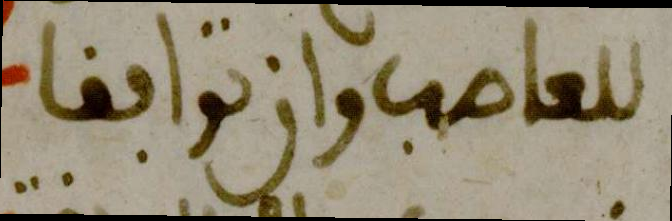للعاصب وان توافقا
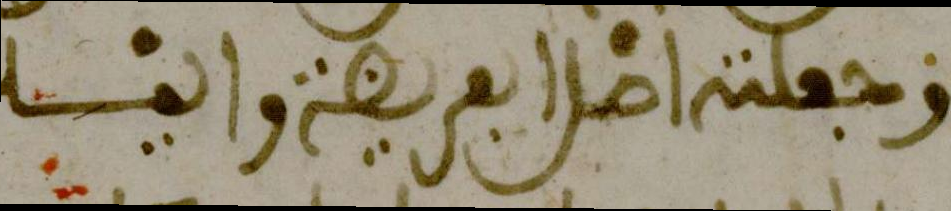وجعلته اصل الفريضة واليه
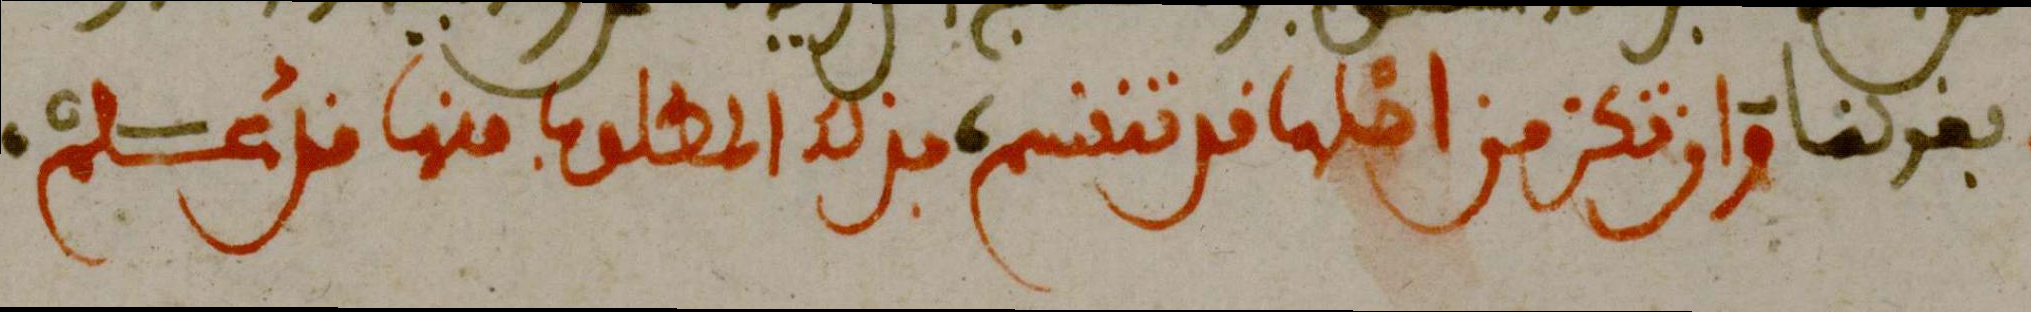بقولنا وان تكن من اصلها قد تقسم فذلك المطلوب منها فد علم
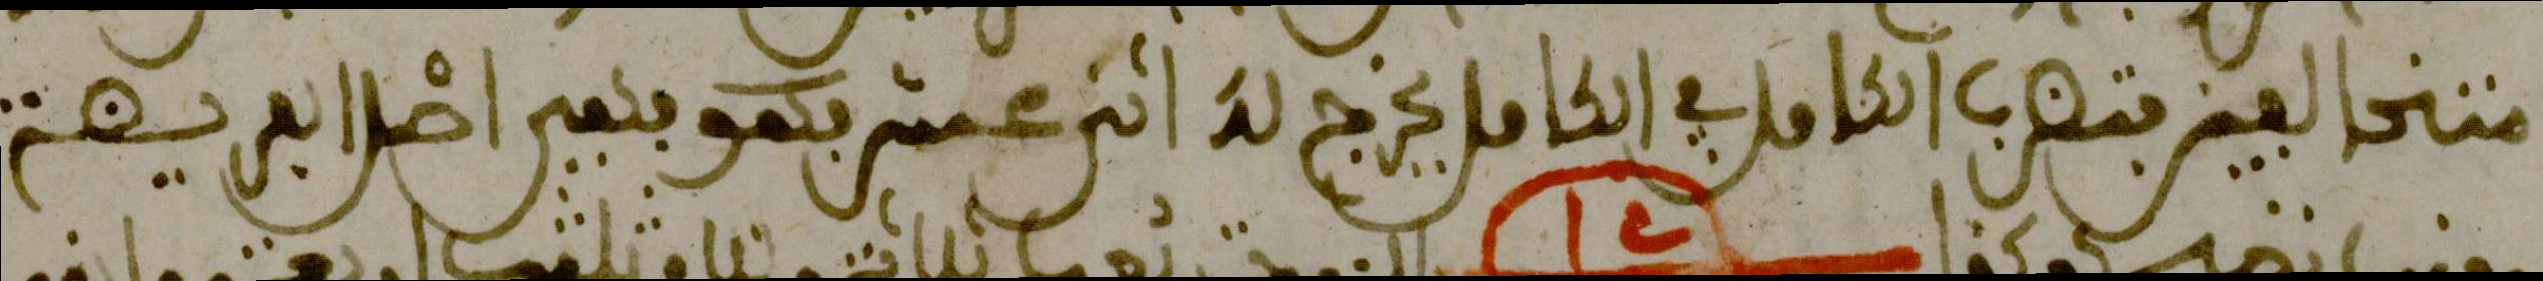متخالفين فتضرب الكامل في الكامل يخرج لك اثنى عشر بهو فهي اصل الفريضة
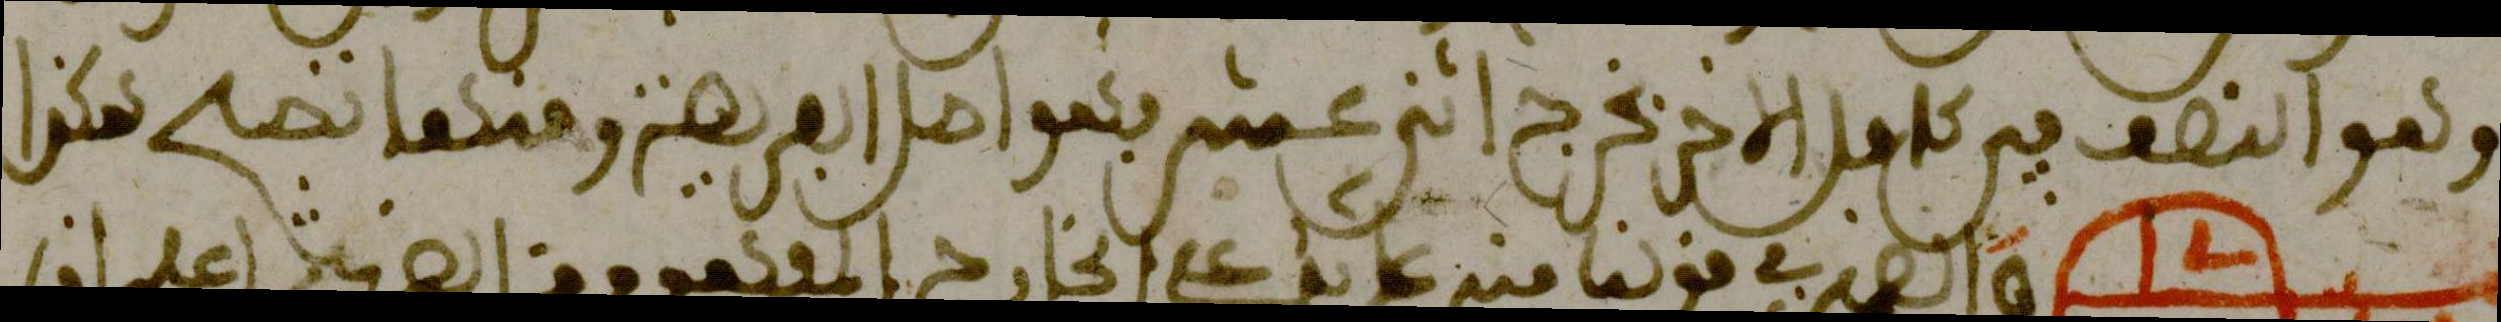وهو النصف في كامل الاخر خرج اثنى عشر بهو اصل الفريضة ومنها تصح هكذا
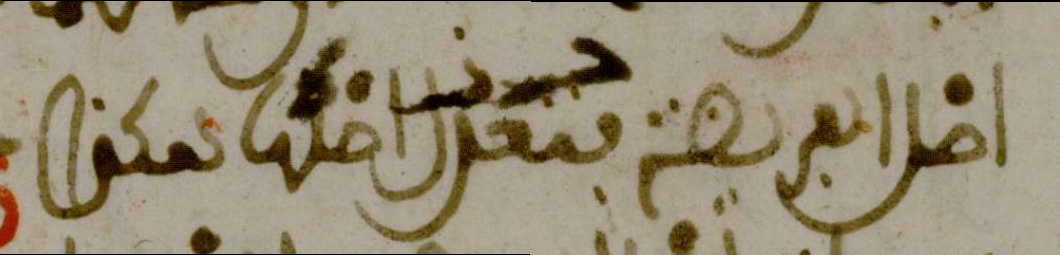اصل الفريضة فتعدل اصلها هكذا
